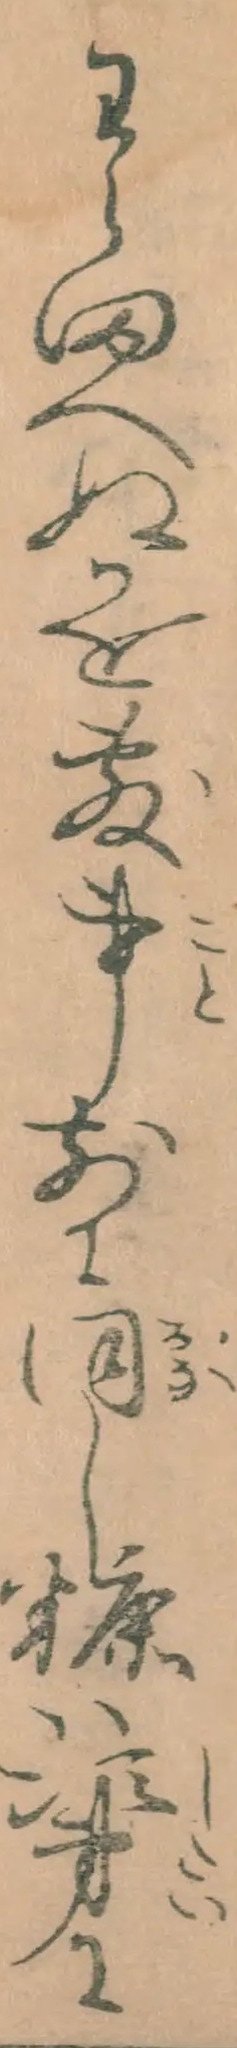わら田へぬかを敷事前に同し糠は次第に
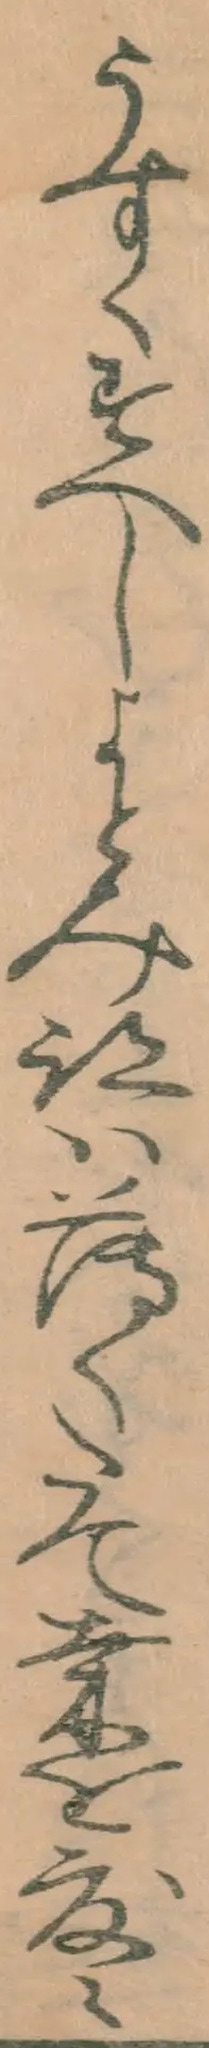うすくすへしよとみ跡は薄くたて桑を度々
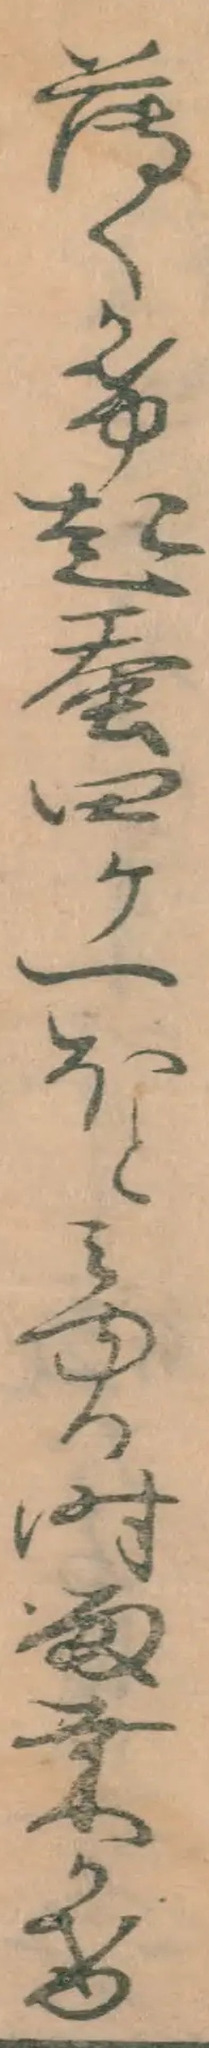薄くかけ起蚕四ヶ一ほとみゆる時留桑かけ
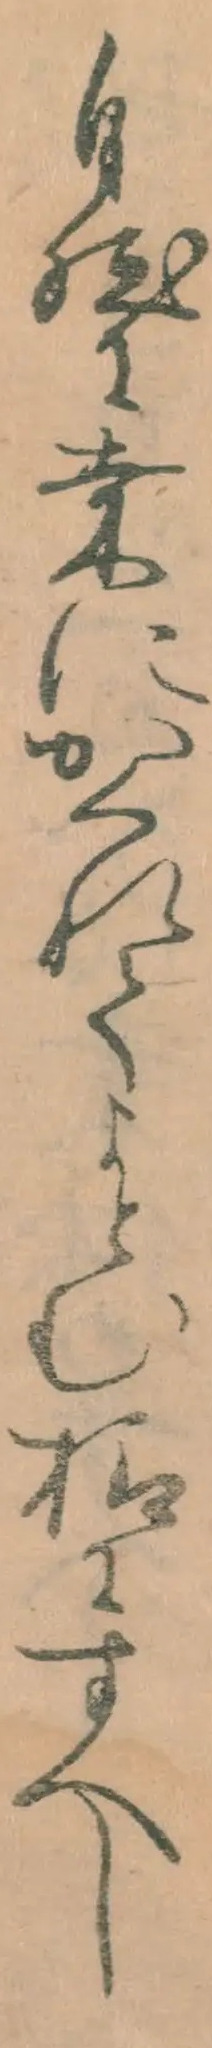自然に桑にかくれてよとむ様にすへし
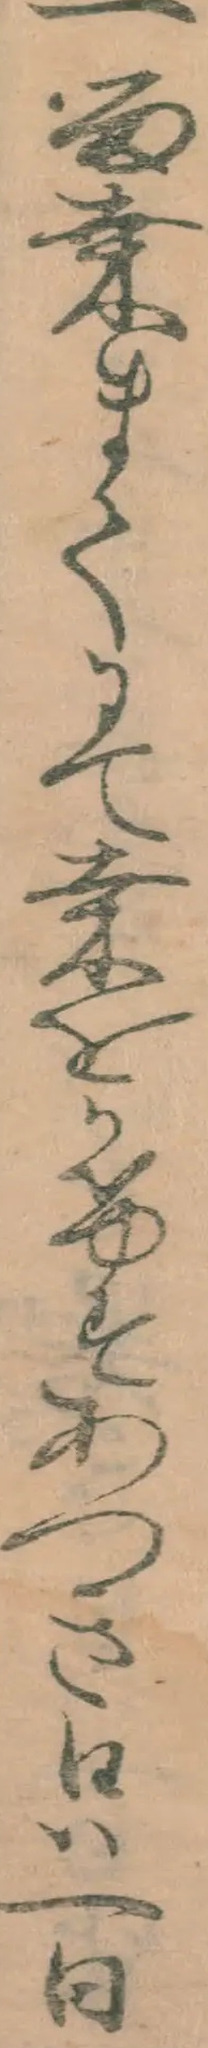一留桑まてにて桑をかけすあつき日は一日
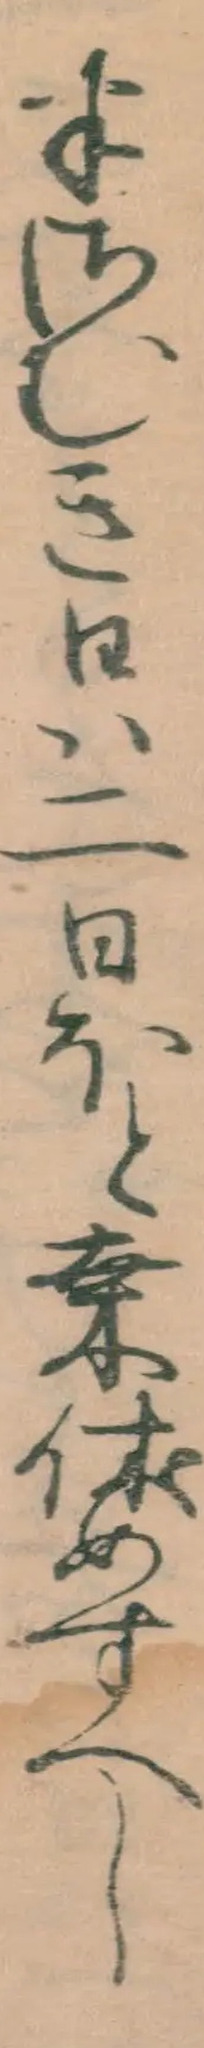半さむき日は二日ほと桑休めすへし
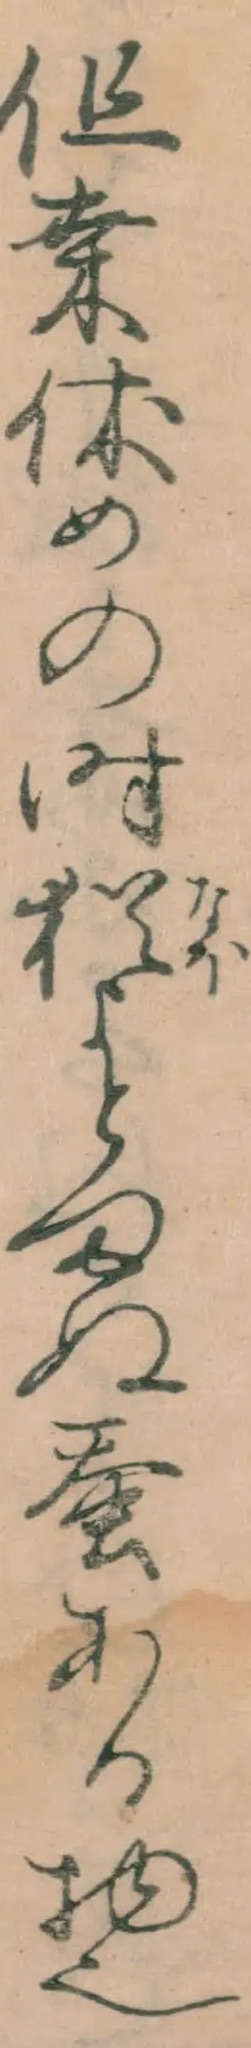但桑休めの時猶よとまぬ蚕ある物也
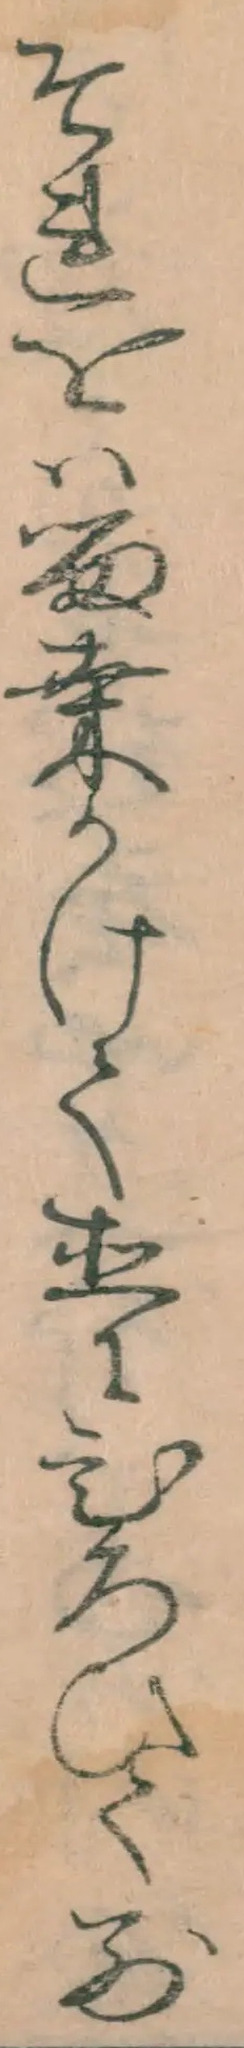それをは留桑かけて直にひろひて別
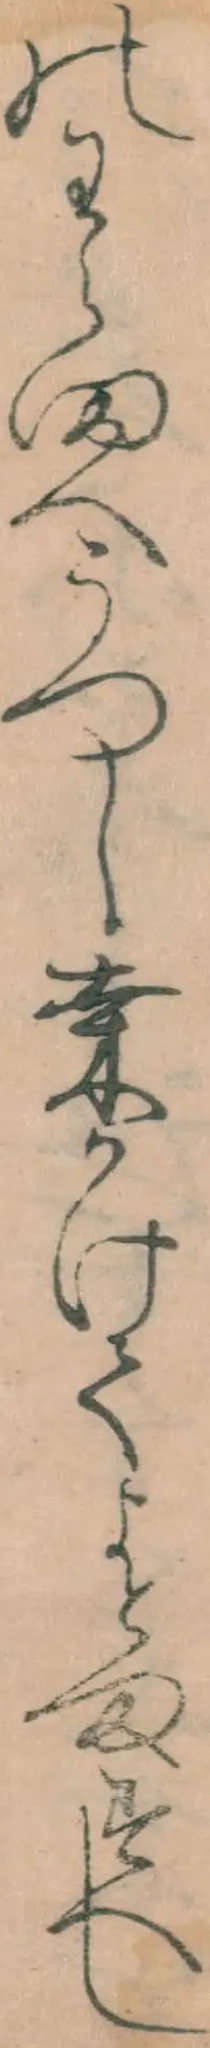のわら田へうつし桑かけてよとますへし
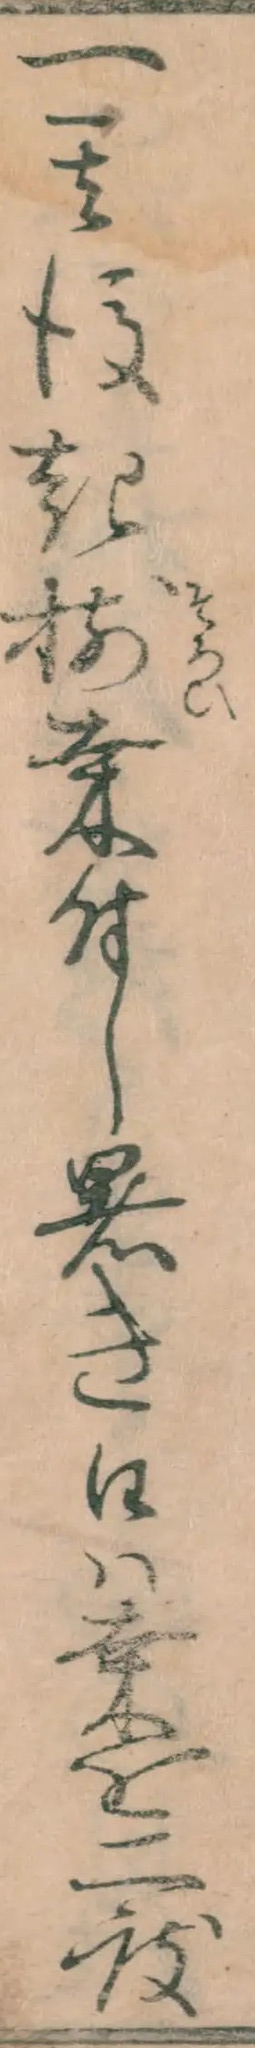一其後起揃桑付し暑き日は桑を二度
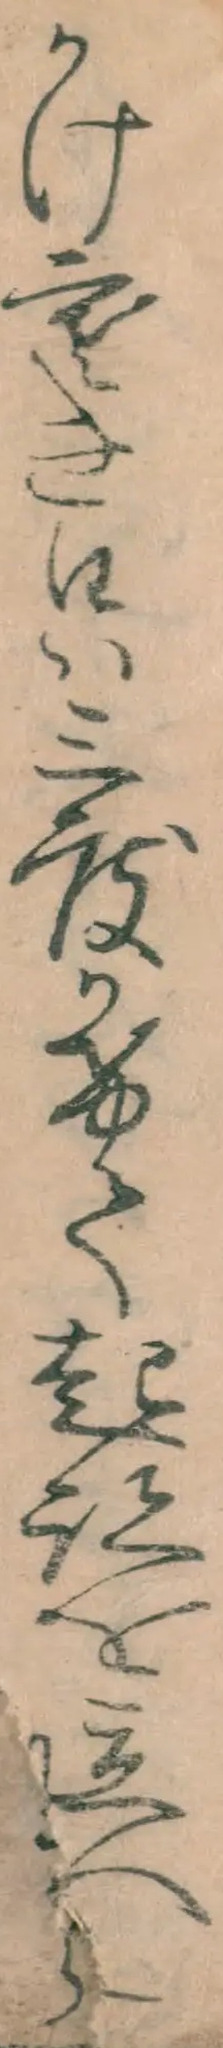かけ寒き日は三度かけて起跡を立へ
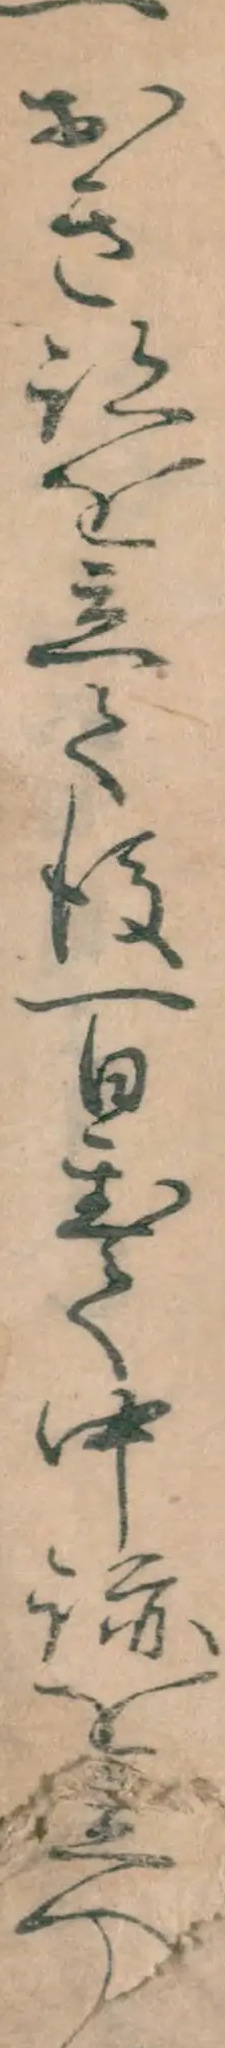一おき跡を立て後一日置て中跡を立へ

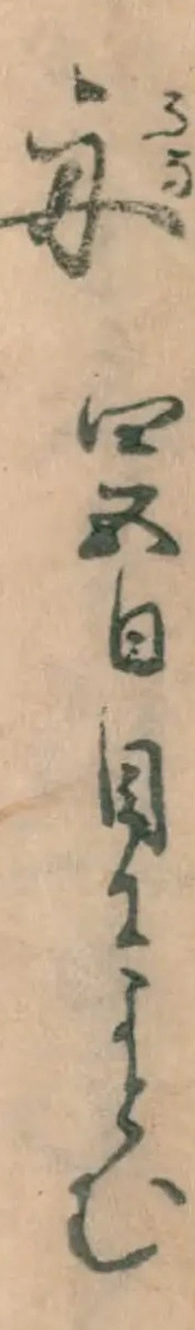舟四五日目によとむ
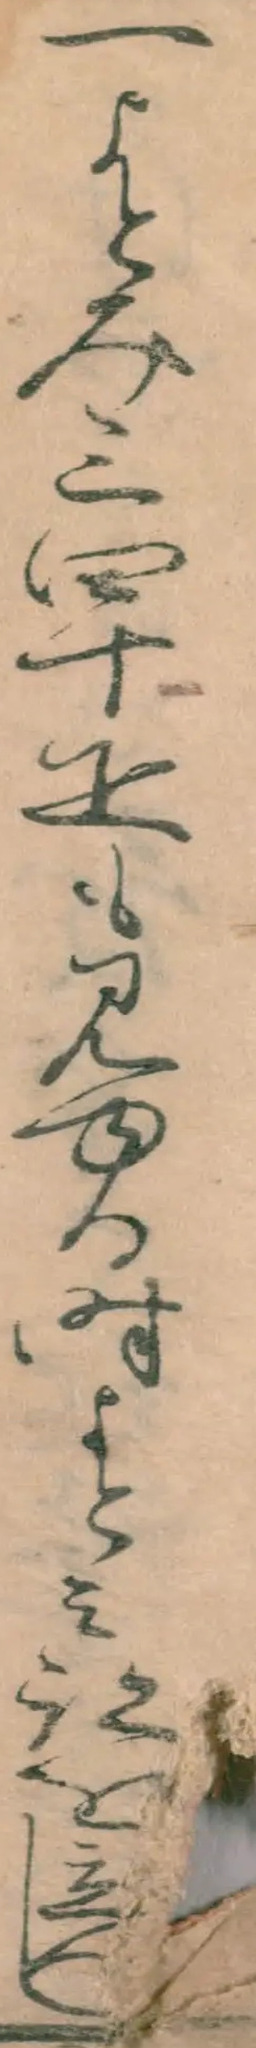一よとみ三四十疋も見ゆる時よとみ跡を立へし
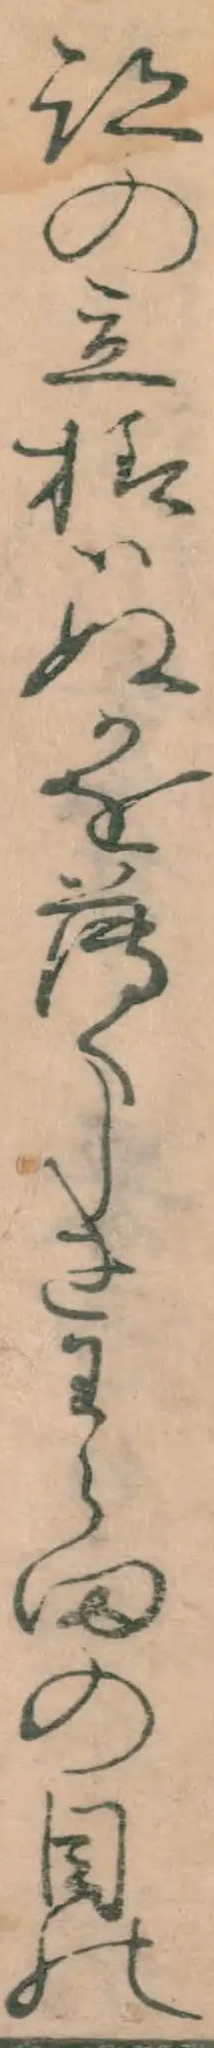跡の立様はぬかを薄くしきわら田の目の
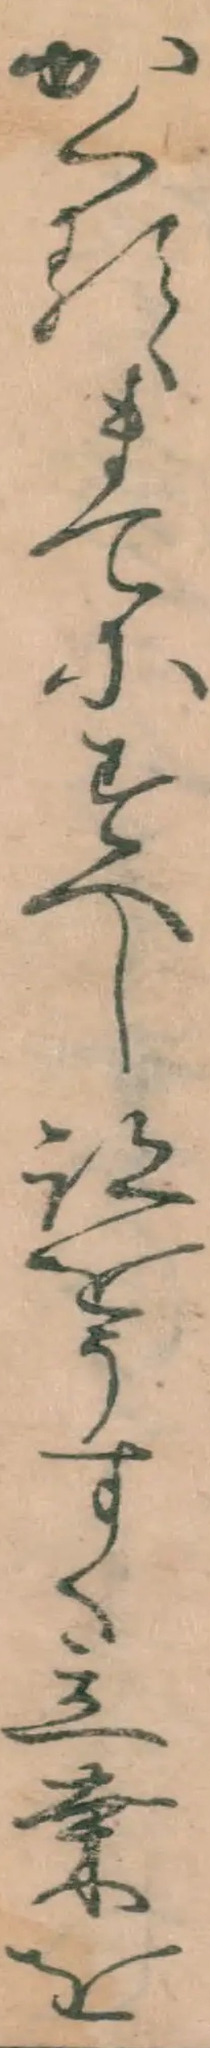かくるゝまてにすへし跡をうすく立桑を
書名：養蚕手引
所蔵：国立国会図書館 National Diet Library, JAPAN
